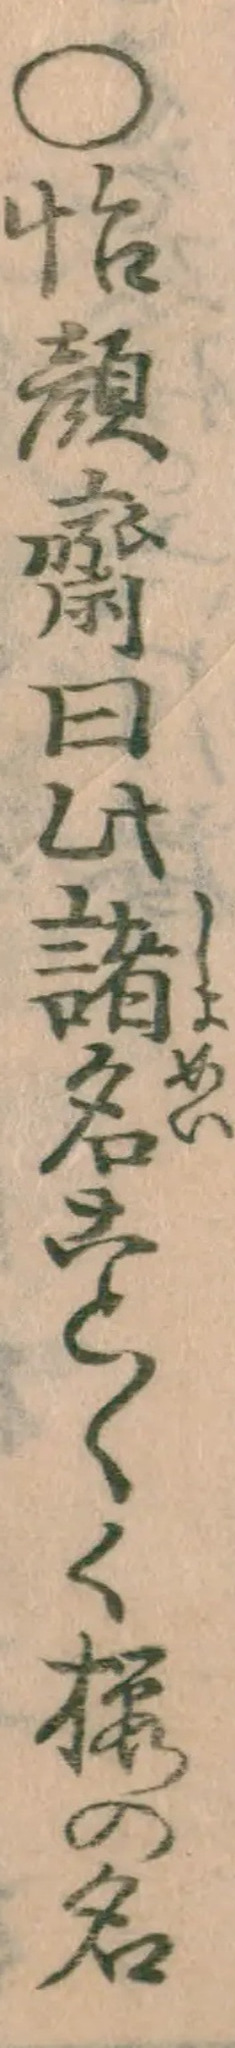○怡顔斎曰此諸名こと〳〵く桜の名
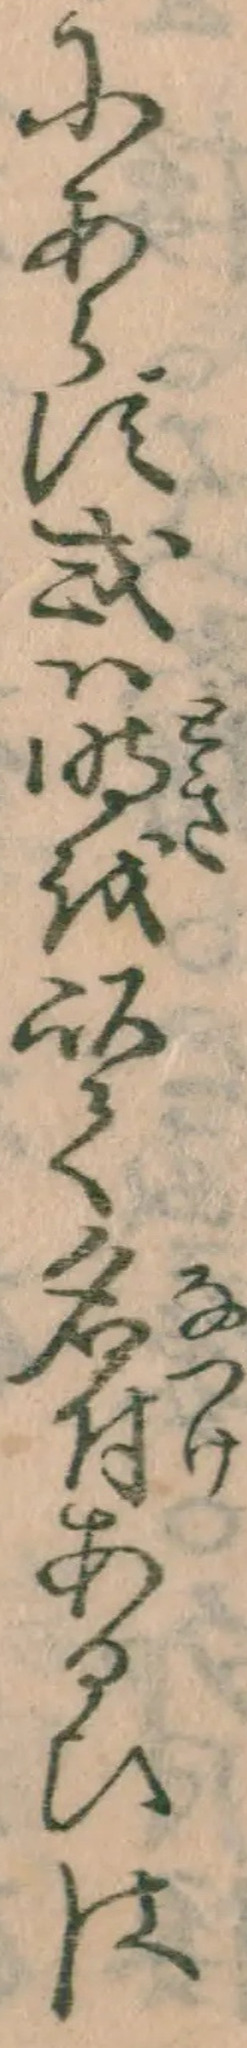にあらず或は時を以て名付あるひは
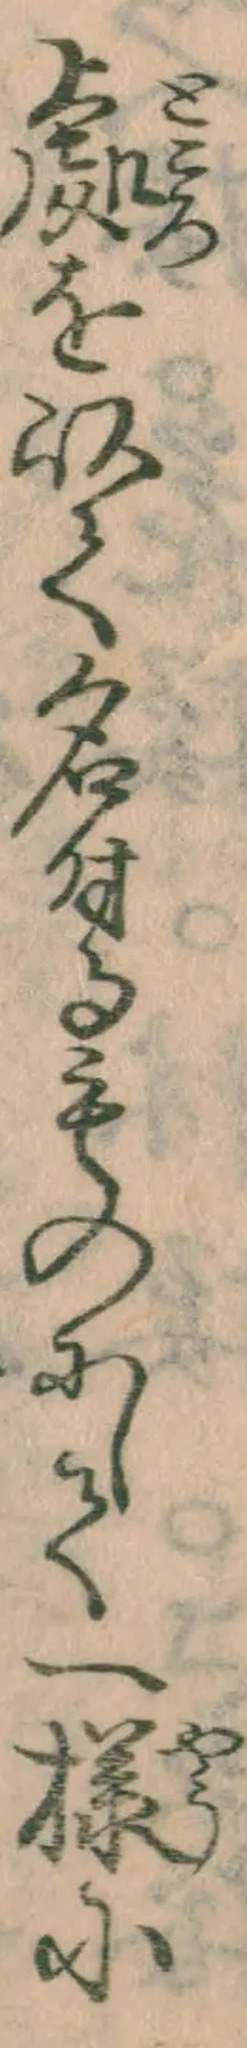処を以て名付るものにして一様に
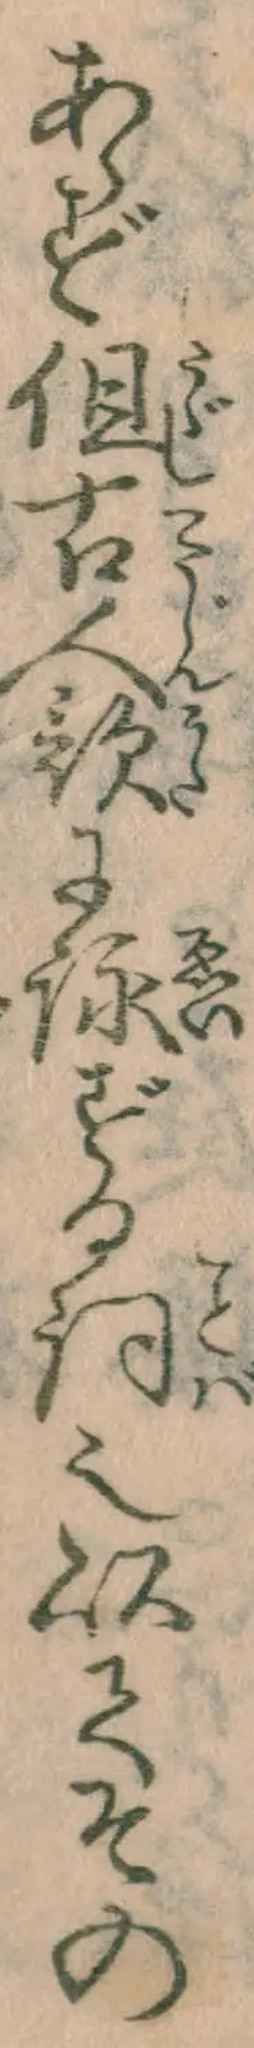あらず但古人歌に詠ずる詞也以てその
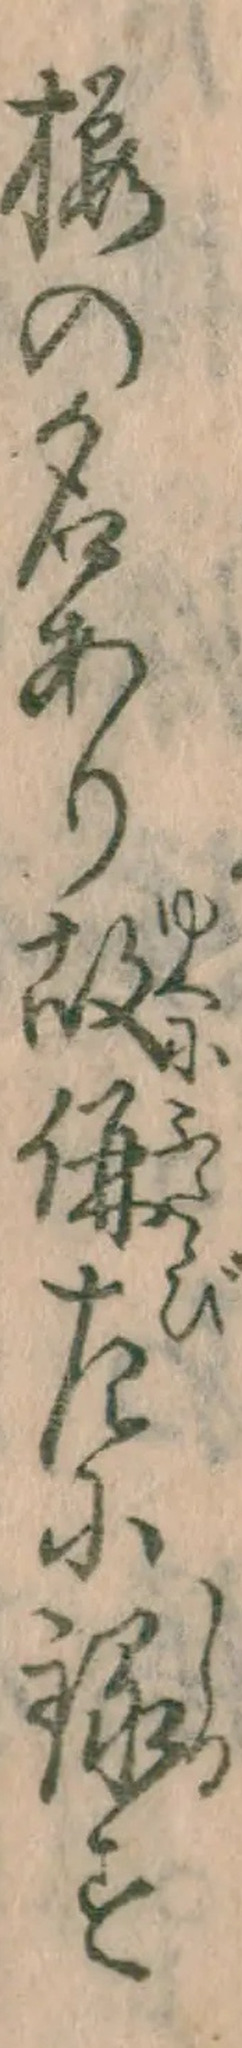桜の名あり故再左に録す
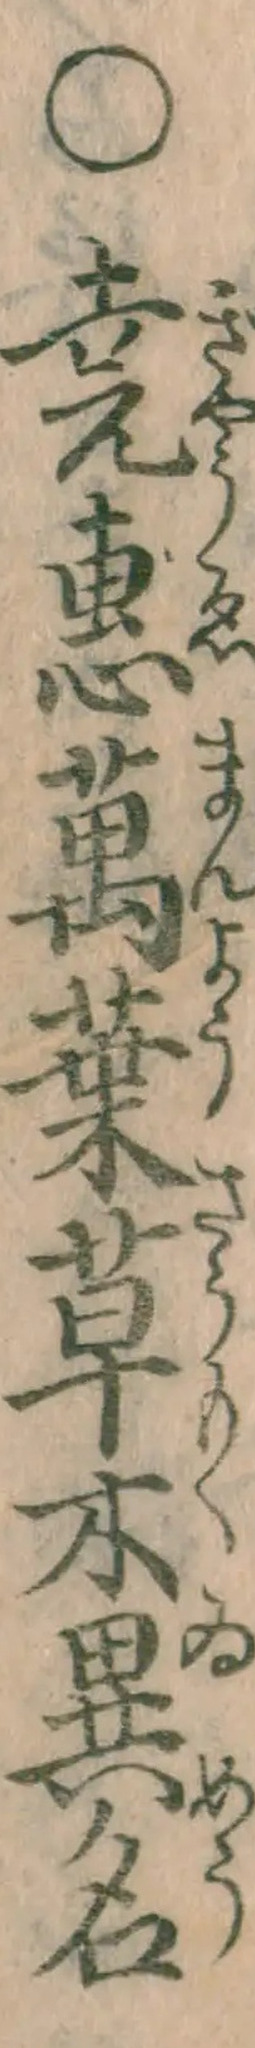○堯恵万葉草木異名

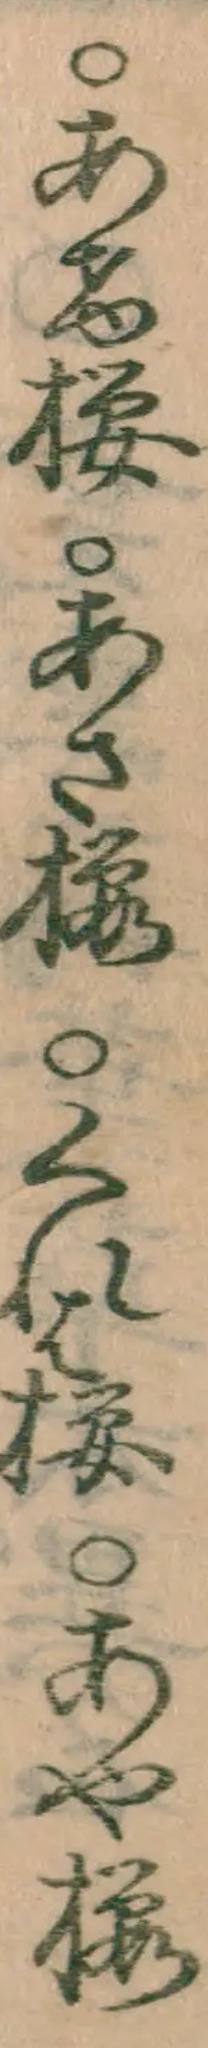○あけ桜○あさ桜○くれは桜○あや桜
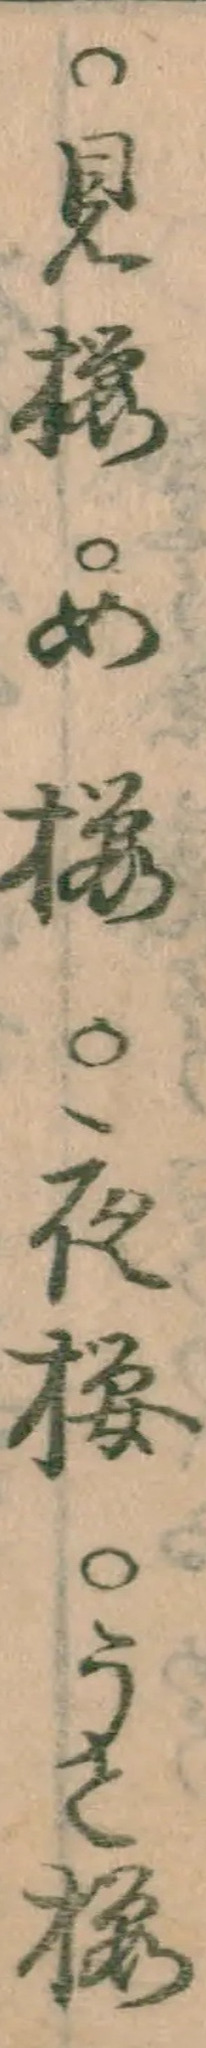○見桜○め桜○夜桜○うと桜
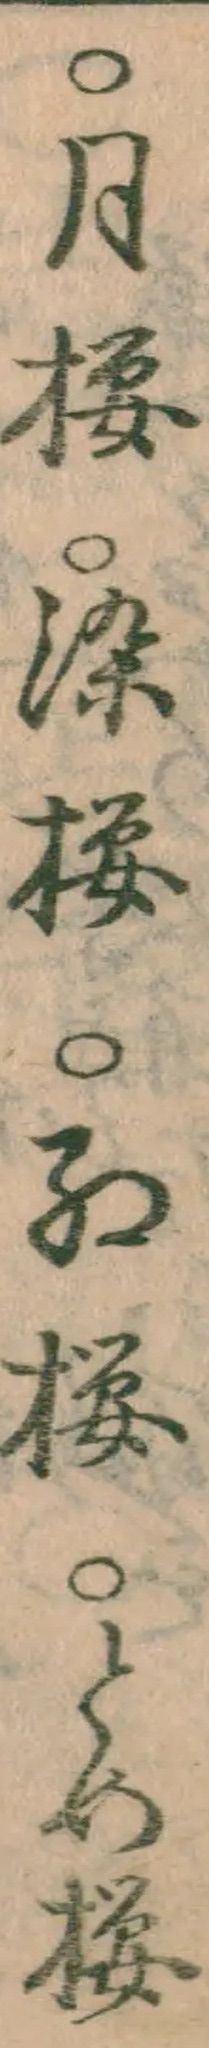○月桜○染桜○紅桜○とめ桜
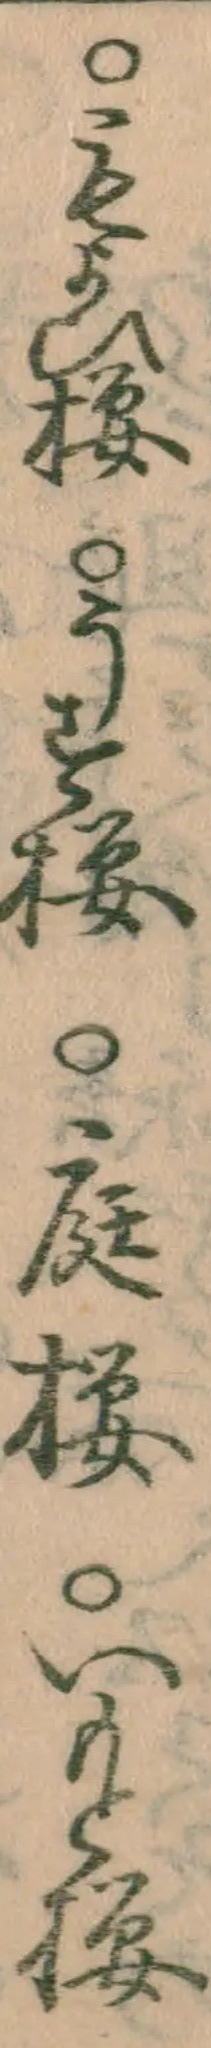○もよひ桜○うす桜○庭桜○いもと桜
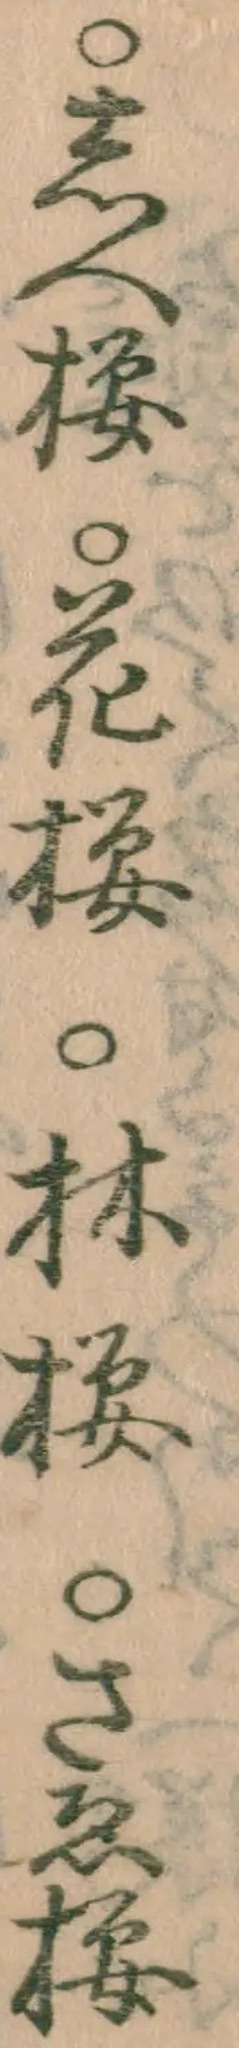○しへ桜○花桜○林桜○さゑ桜
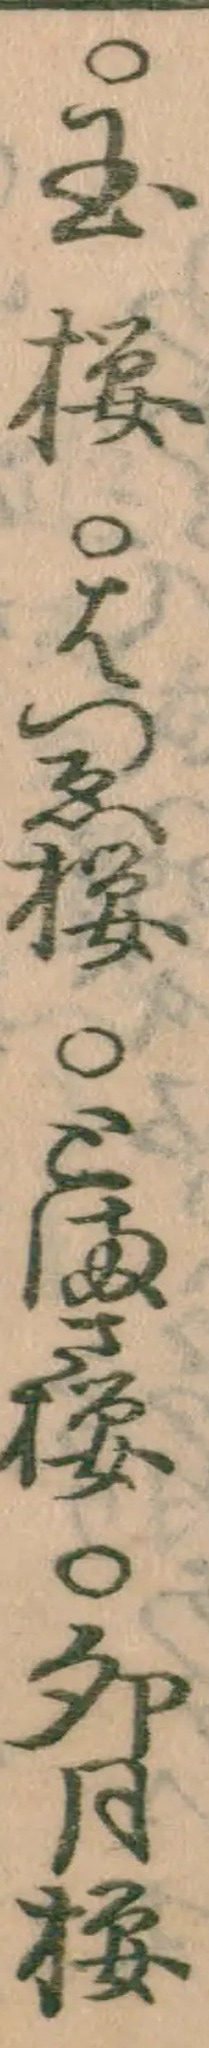○玉桜○はつゑ桜○とまさ桜○卯月桜
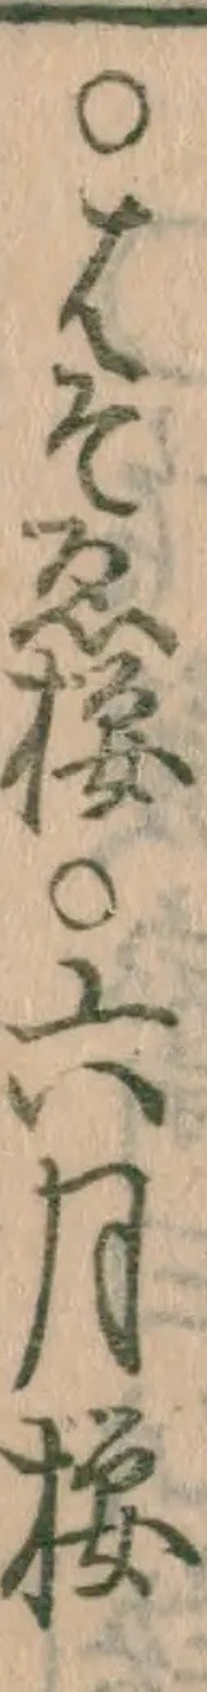○はそゑ桜○六月桜
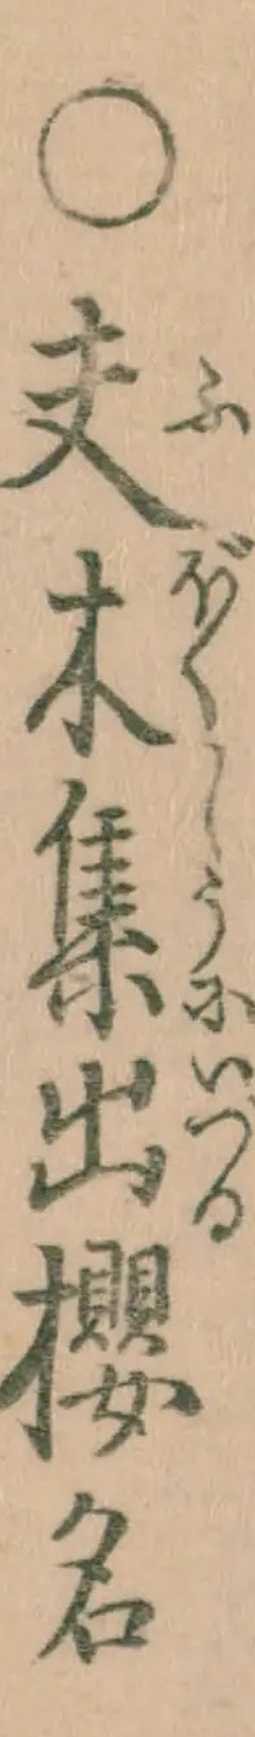○夫木集出桜名
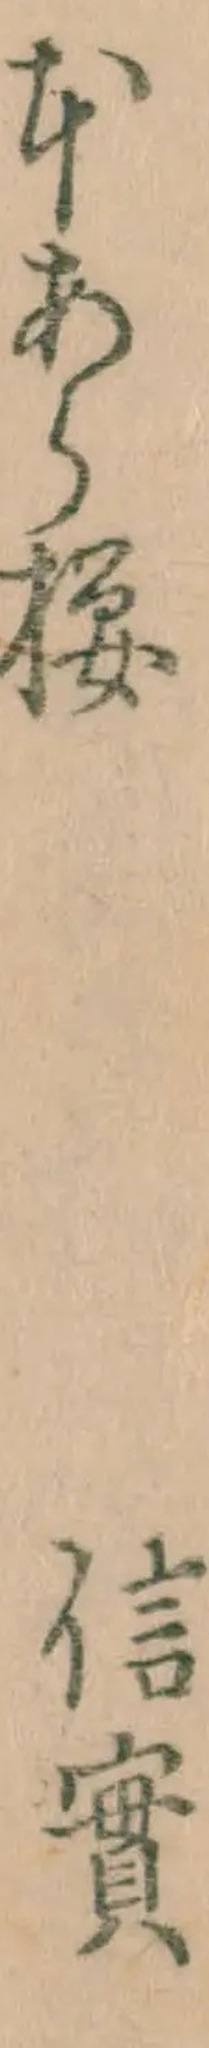本あら桜信実
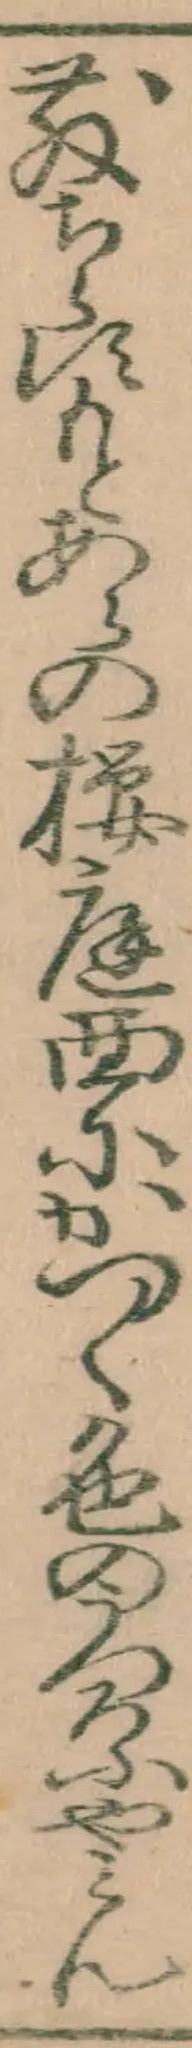敷ちらすもとあらの桜庭西にかつ〳〵色のうつろふやみん
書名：怡顔齋櫻品
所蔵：国立国会図書館 National Diet Library, JAPAN
